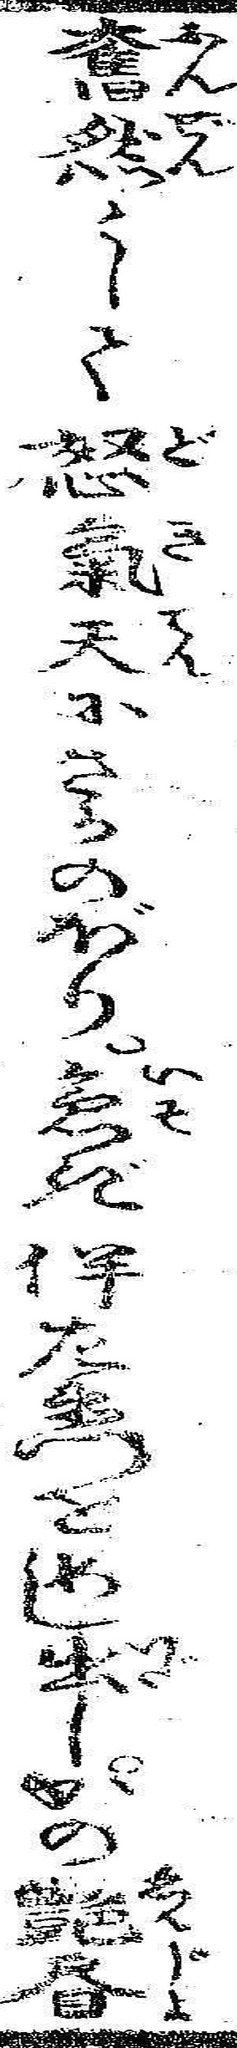奮然として怒気天にさかのぼり。急ぎ伴左衛門をめし出し。かの艶書
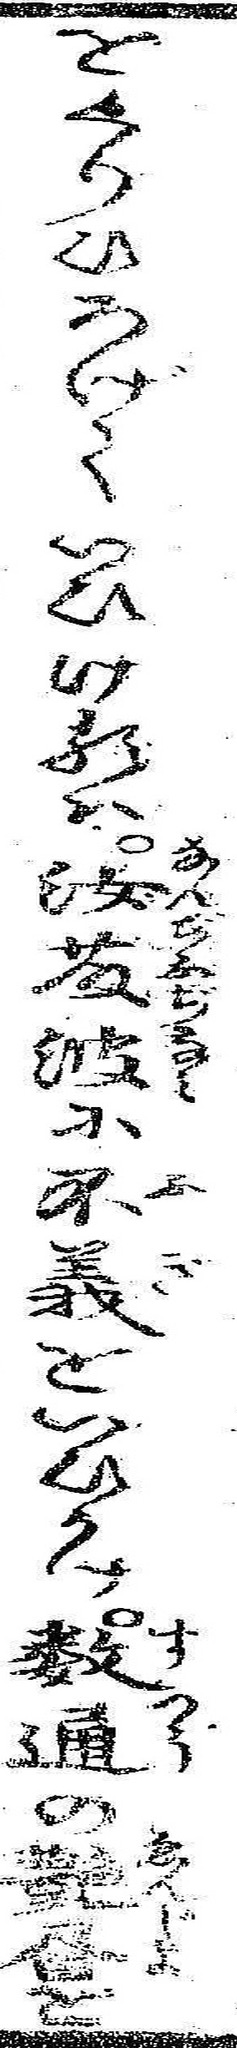をくりひろげていひけるは。汝藤波に不義をいひかけ。数通の艶書を
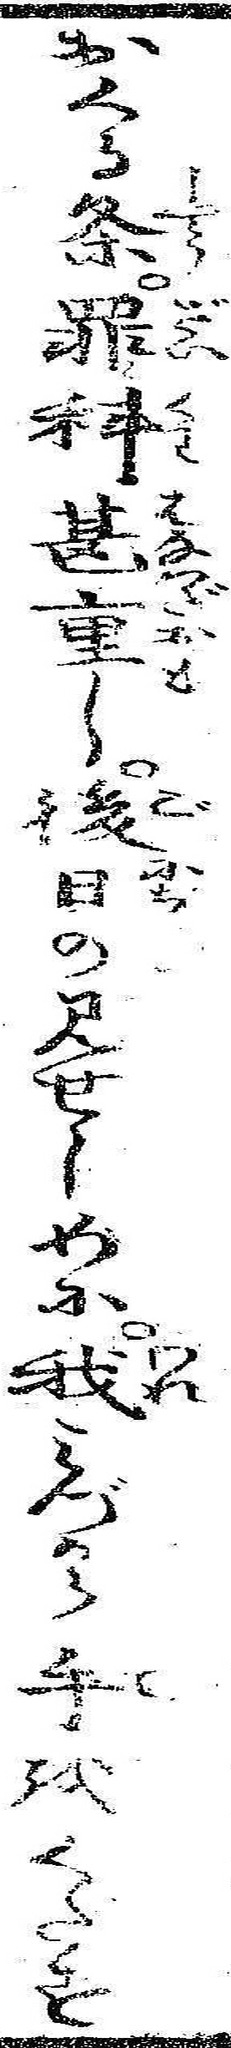おくる条。罪科甚重し。後日の見せしめに。我みづから手をくだす
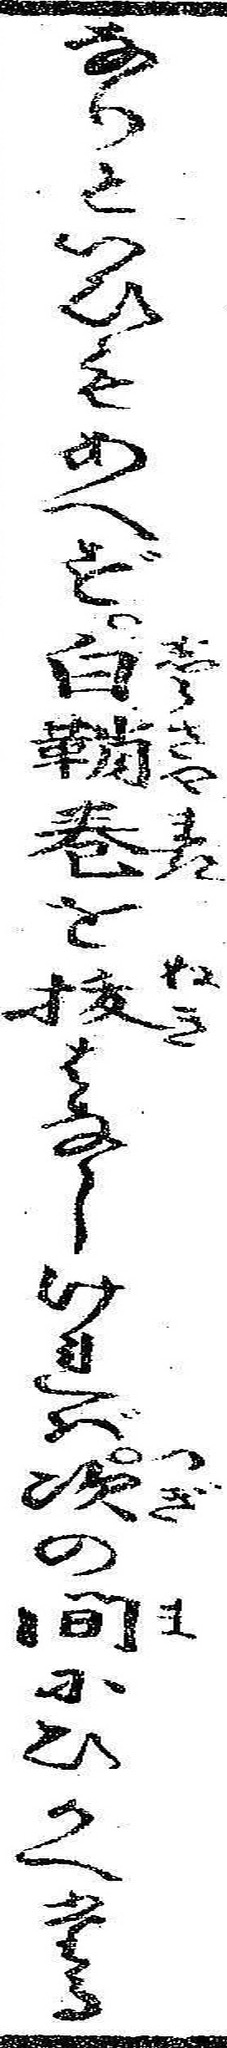なりといひもあへず。白鞘巻を抜はなしければ。次の間にひかへたる
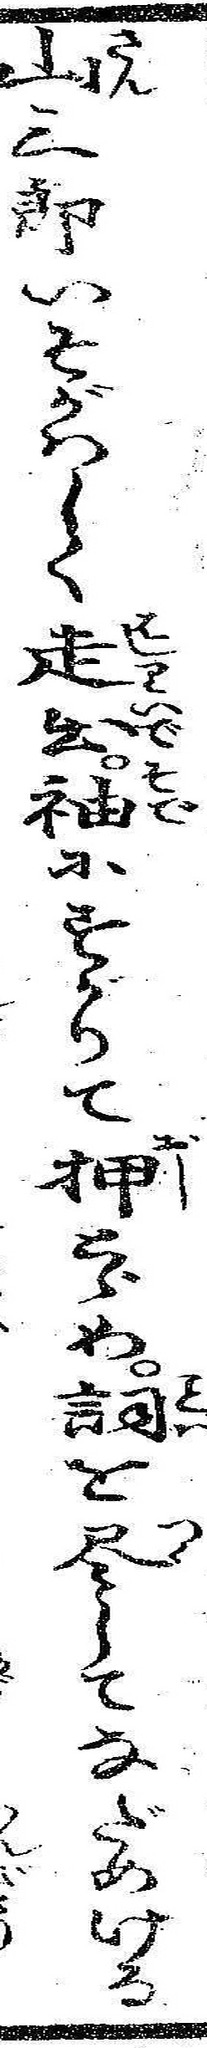山三郎いそがはしく走出。袖にすがりて押とゞめ。詞を尽してなだめける
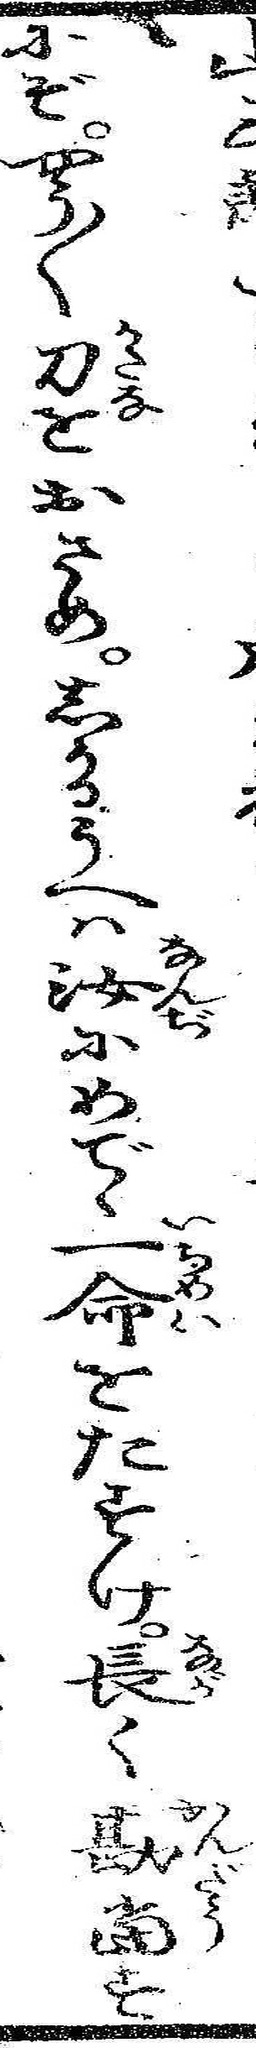にぞ。やう〳〵刀をおさめ。しかるうへは汝にめでゝ一命をたすけ。長く勘当す
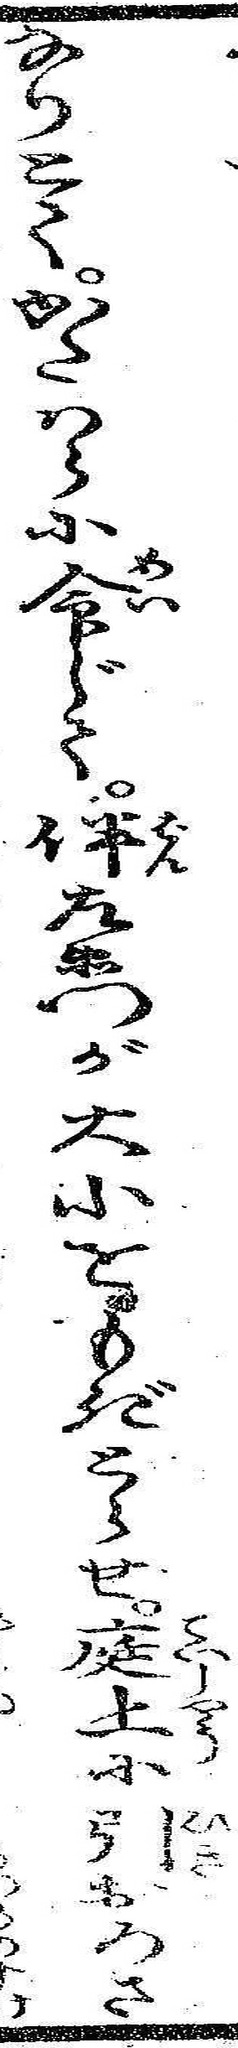なりとて。かたはらに命じて。伴左衛門が大小をもぎとらせ。庭上に引おろさ
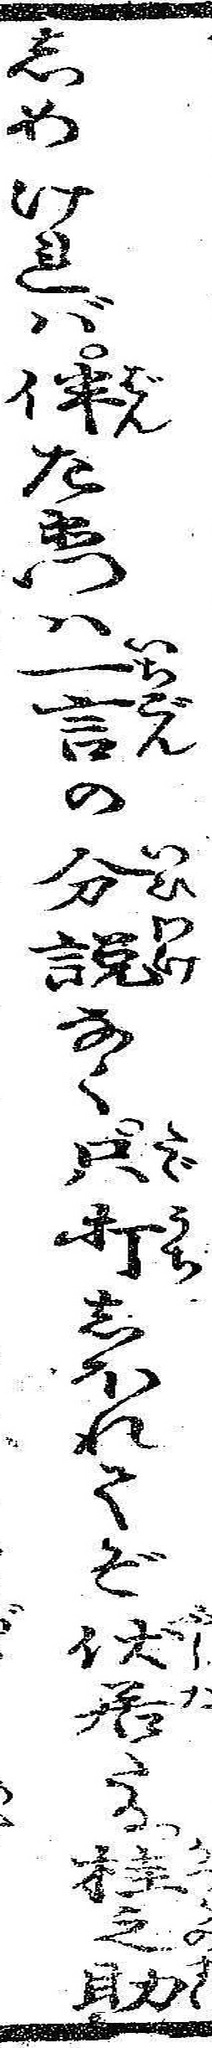しめければ。伴左衛門は一言の分説なく。只打しほれてぞ伏居たる。桂之助
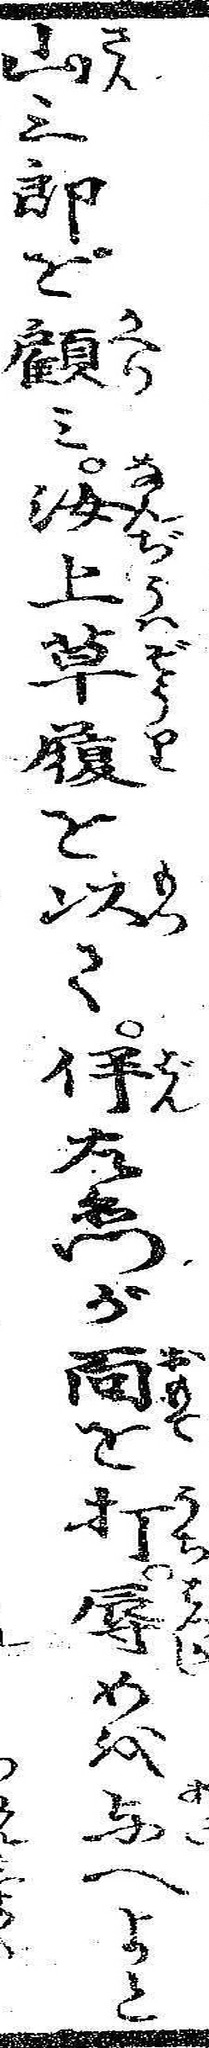山三郎を顧み。汝上草履を以て。伴左衛門が面を打。辱めを与へよと
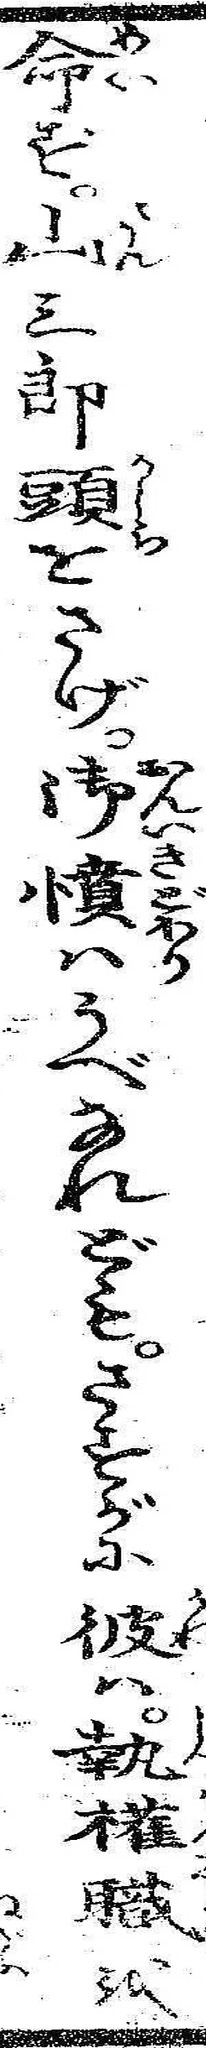命ず。山三郎頭をさげ。御憤はうべなれども。さすがに彼は。執権職を
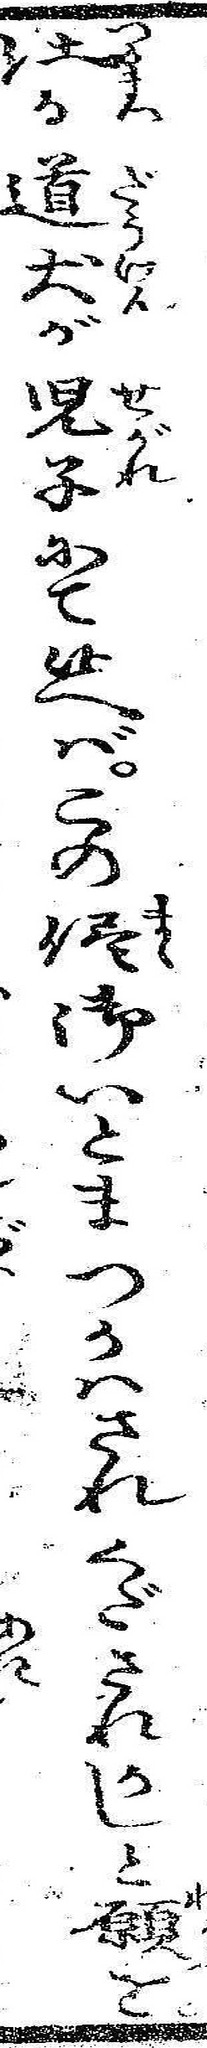仕る道犬が児子にて候へば。この侭御いとまつかはされくだされかしと願を。
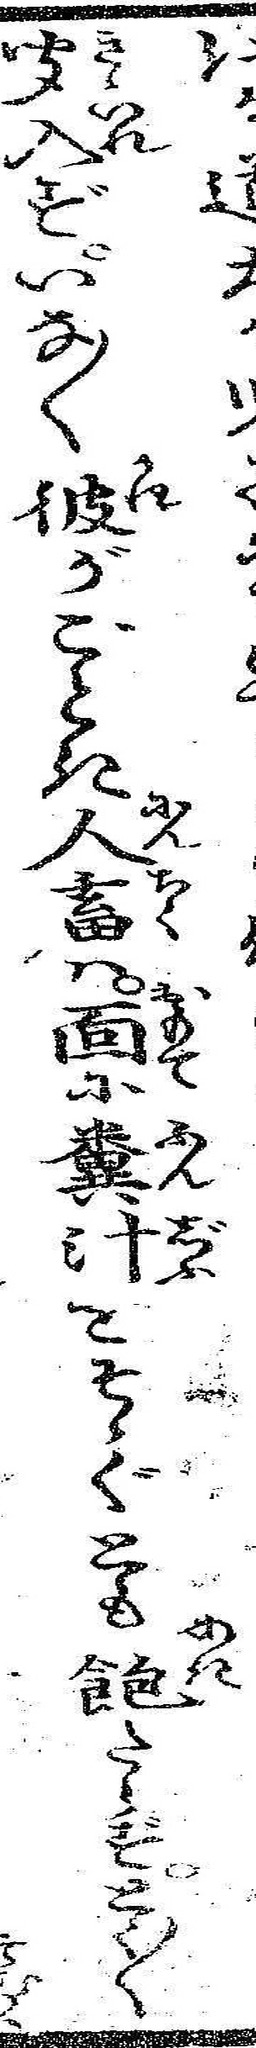聞入ず。いな〳〵彼がごとき人畜は面に糞汁をそゝぐとも飽たらず。とく〳〵
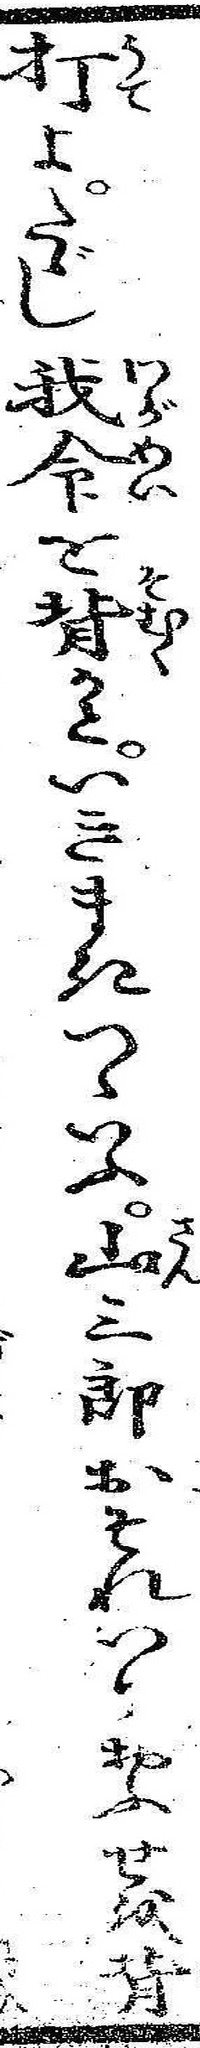打よ。たゞし我命を背かと。いきまきつゝいふ。山三郎おそれいりおふせを背
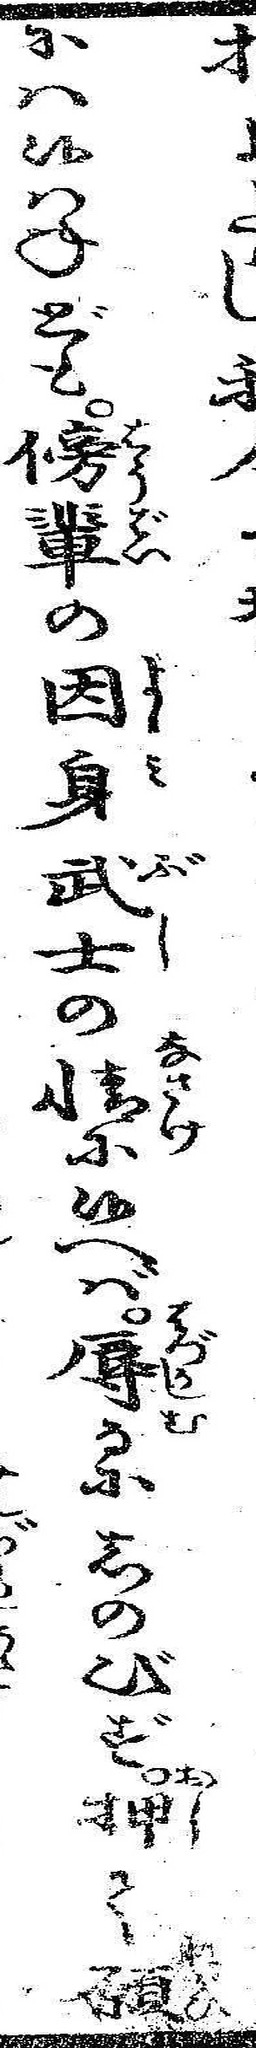には候はねども。傍輩の因身武士の情に候へば。辱るにしのびず。押て願
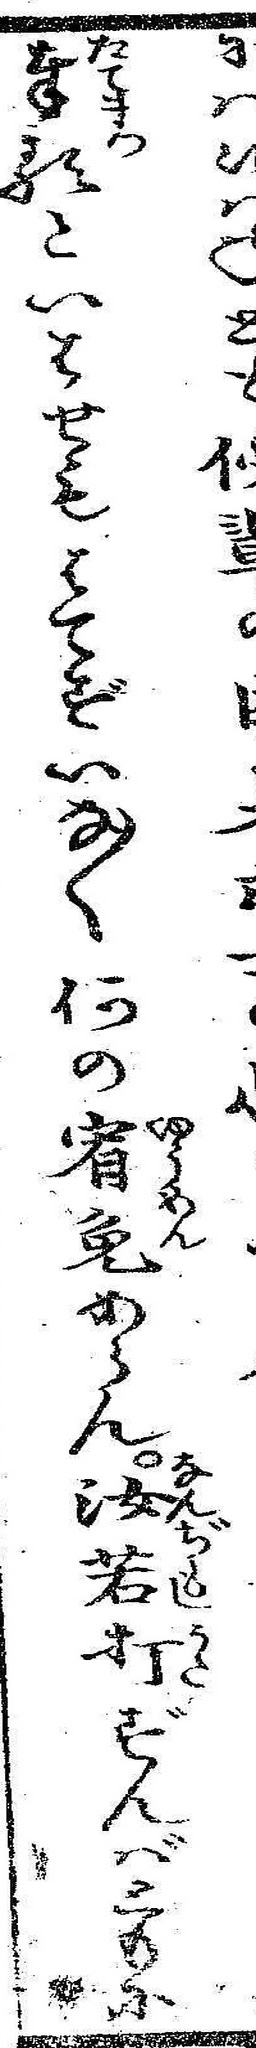奉るといはせもはてずいな〳〵何の宥免あらん。汝若打ずんばともに

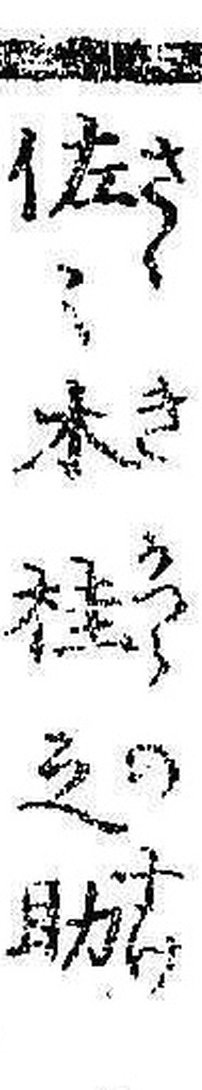佐々木桂之助
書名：昔話稲妻表紙
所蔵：国文学研究資料館
